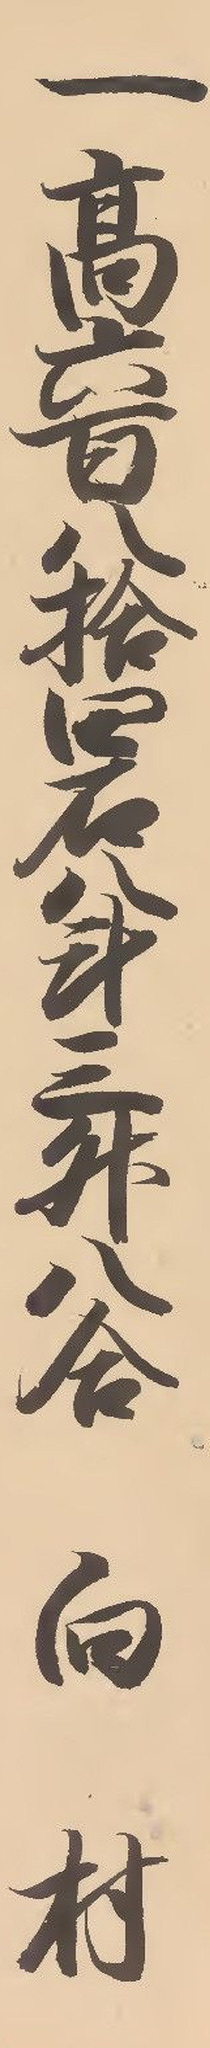一高六百八拾四石八斗三升八合向村
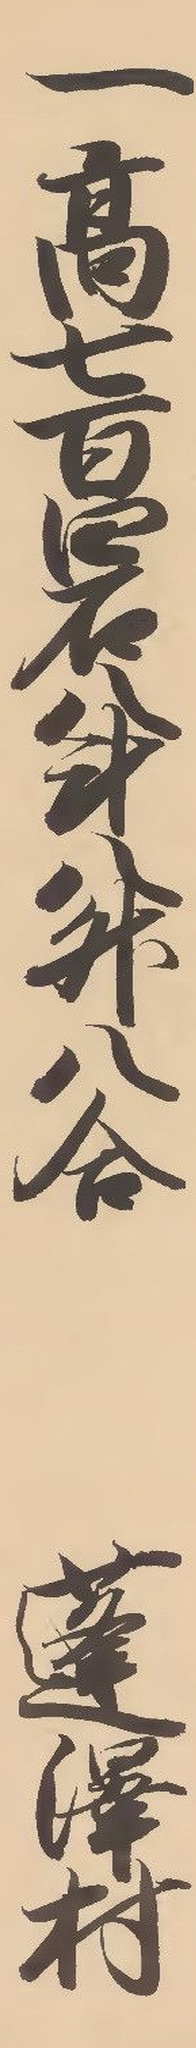一高七百四石八斗八升八合蓬沢村
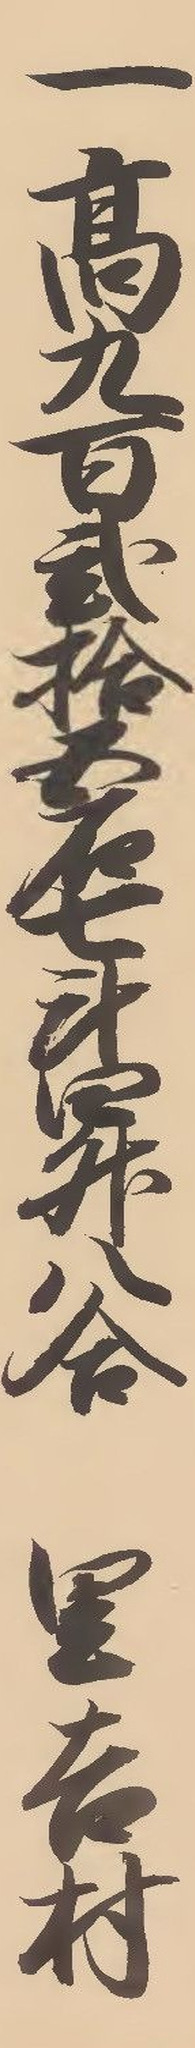一高九百弐拾五石七斗四升八合里吉村
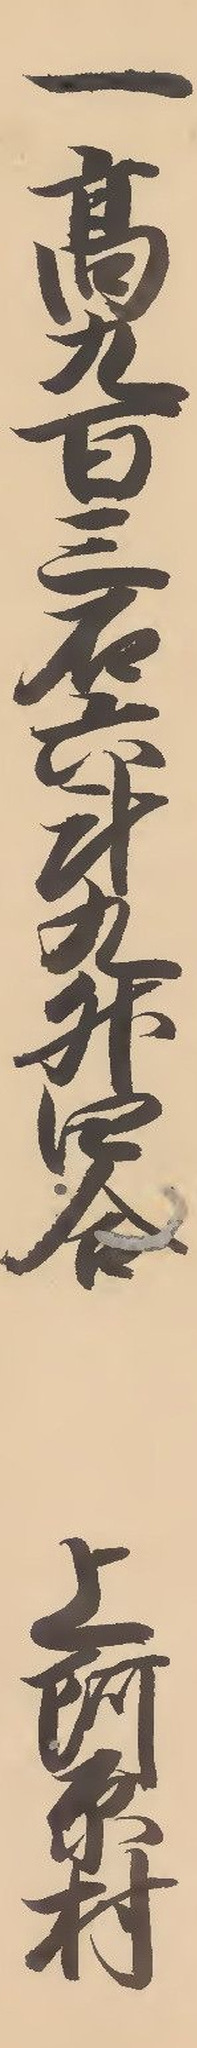一高九百三石六斗九升四合上阿原村

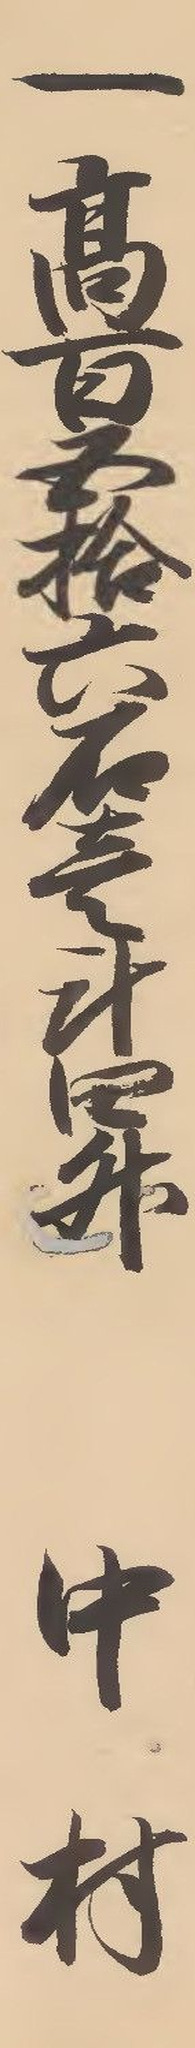一高百五拾六石壱斗四升中村
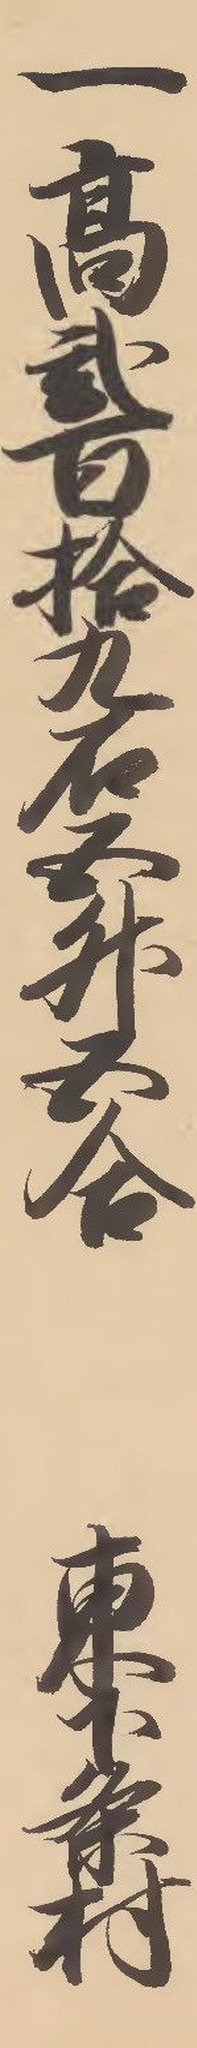一高弐百拾九石五升五合東下条村
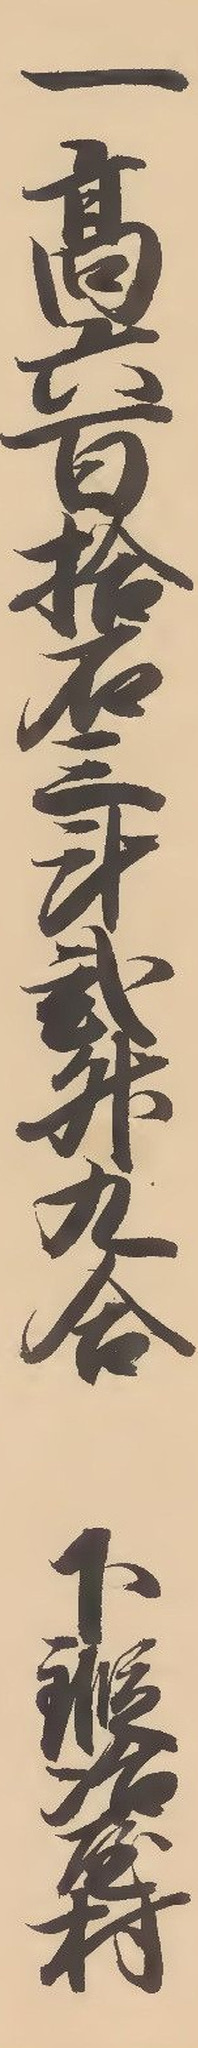一高六百拾石三斗弐升九合下鍛冶屋村
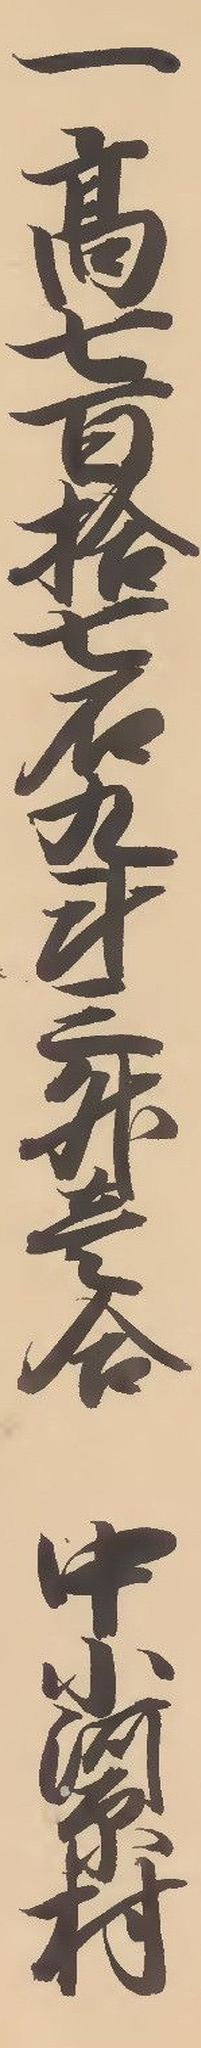一高七百拾七石九斗三升壱合中小河原村
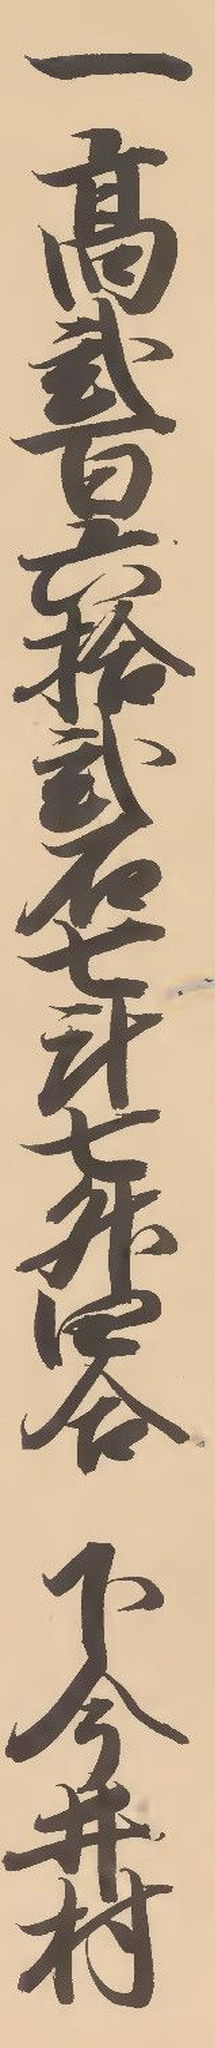一高弐百六拾弐石七斗七升四合下今井村
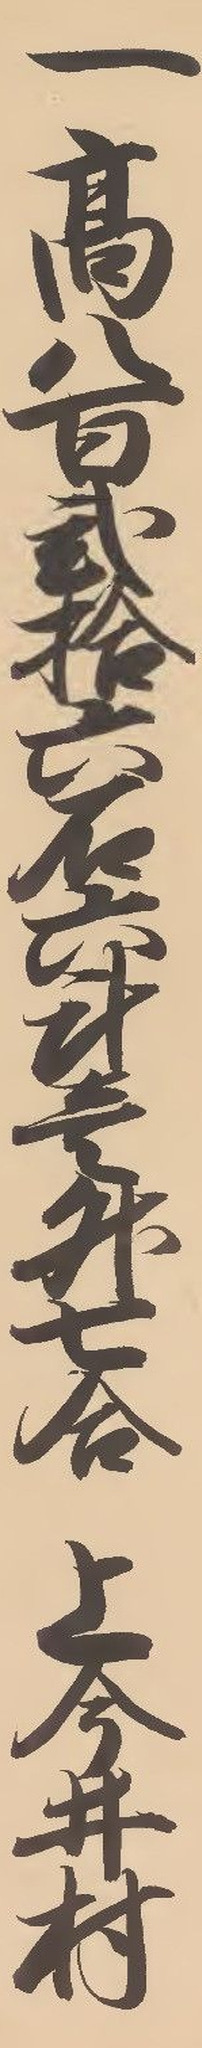一高八百弐拾六石六斗壱升七合上今井村
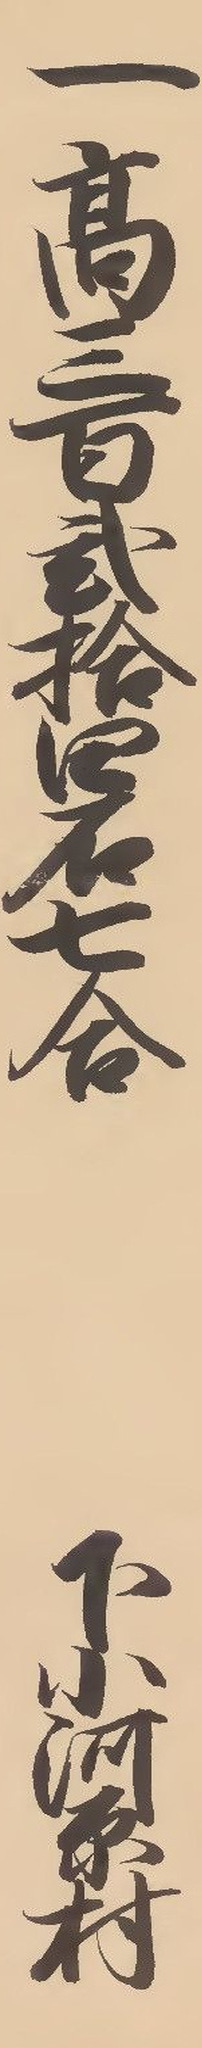一高三百弐拾四石七合下小河原村
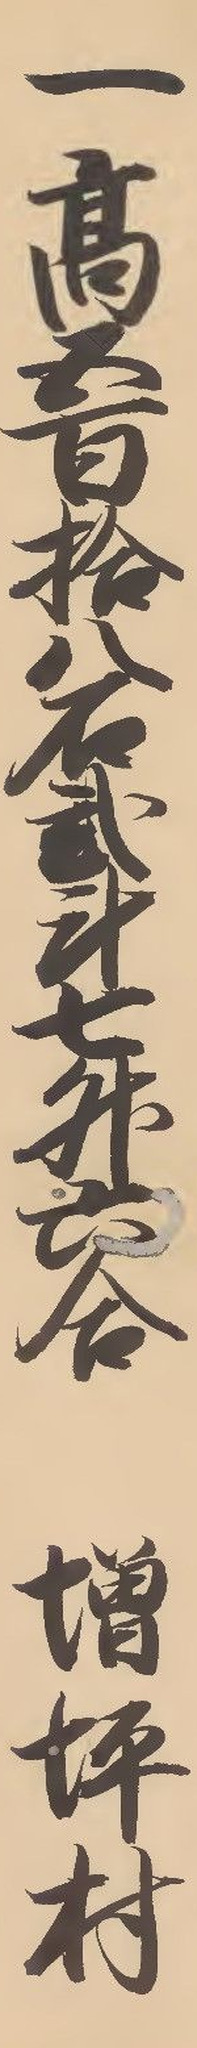一高五百拾八石弐斗七升六合増坪村

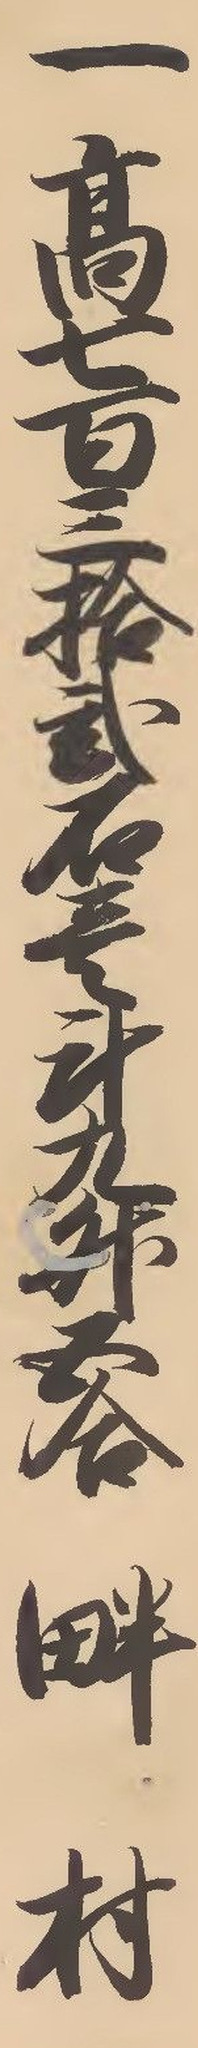一高七百三拾弐石壱斗九升五合畔村
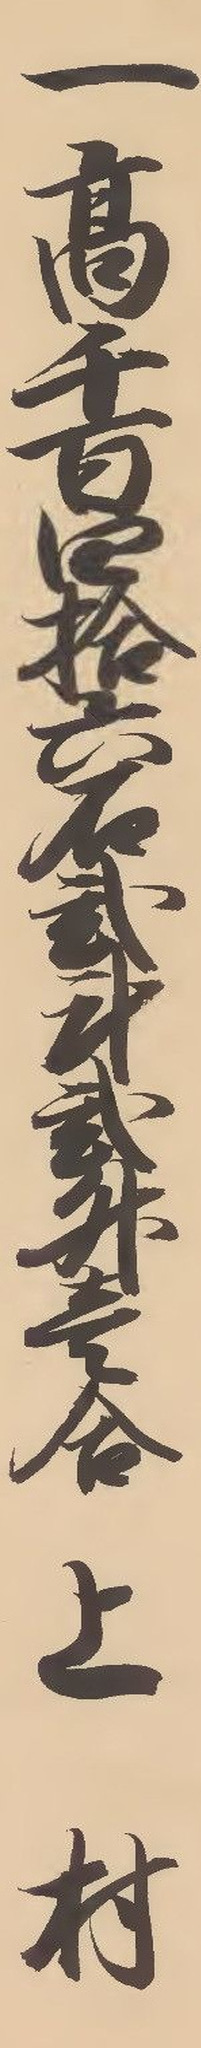一高千百四拾六石弐斗弐升壱合上村
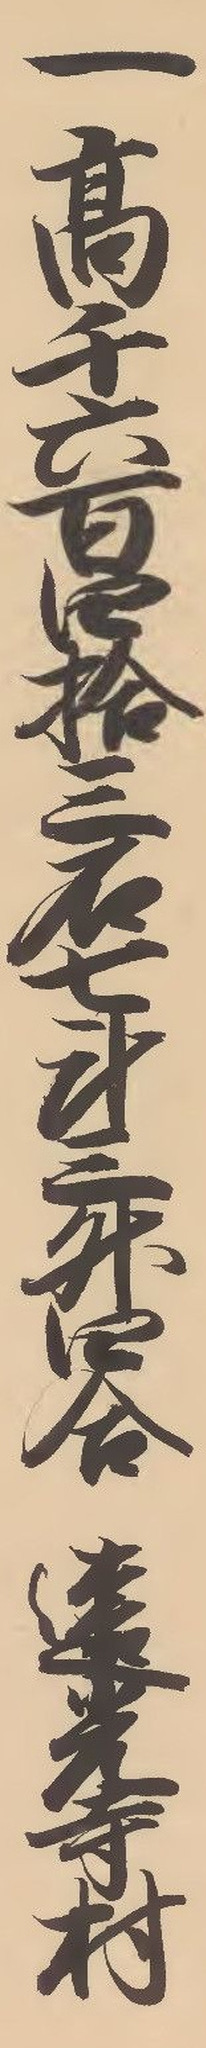一高千六百四拾三石七斗三升四合遠光寺村
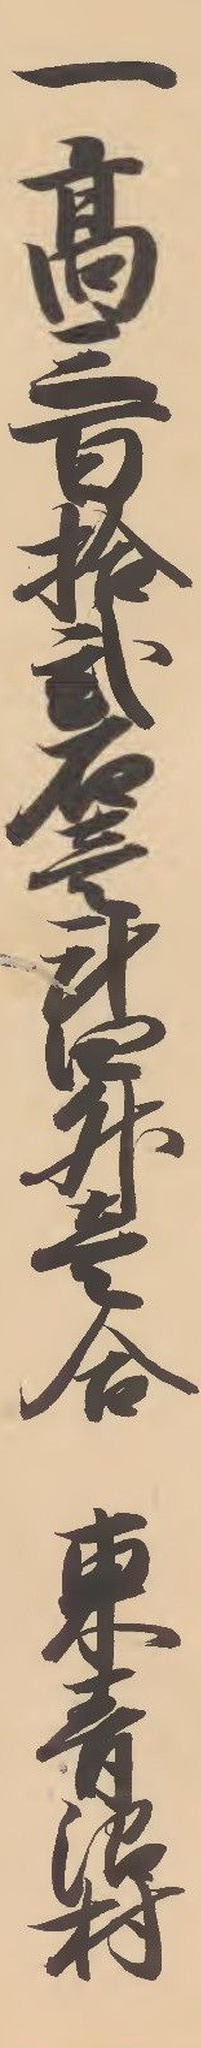一高三百拾弐石壱斗四升壱合東青沼村
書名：甲斐国郷帳
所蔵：国立公文書館 National Archives of Japan
